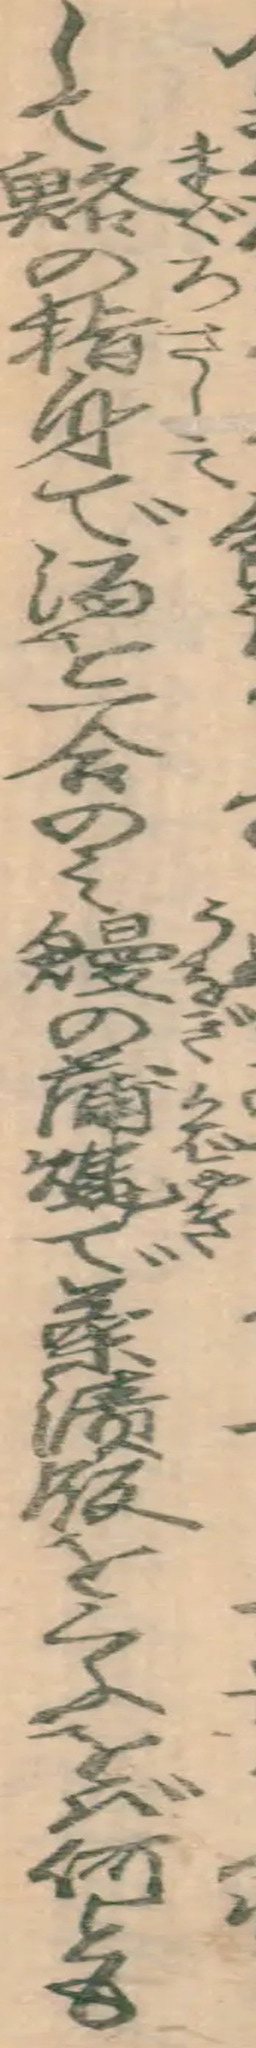して鮥の指身で酒を一合のみ鰻の蒲焼で茶漬飯をくふをば何とも

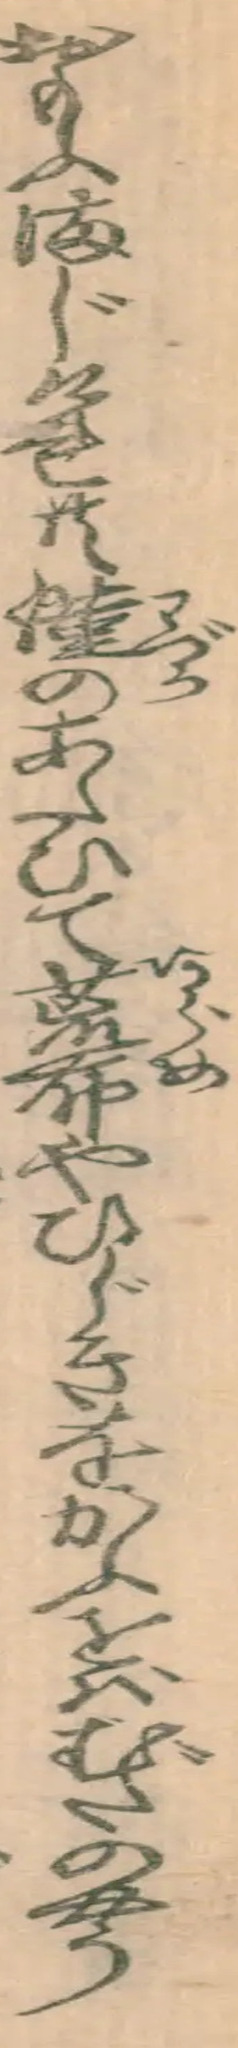おもふまじけれ共僅のあたひて荒布やひじきをかふをばむだのやう
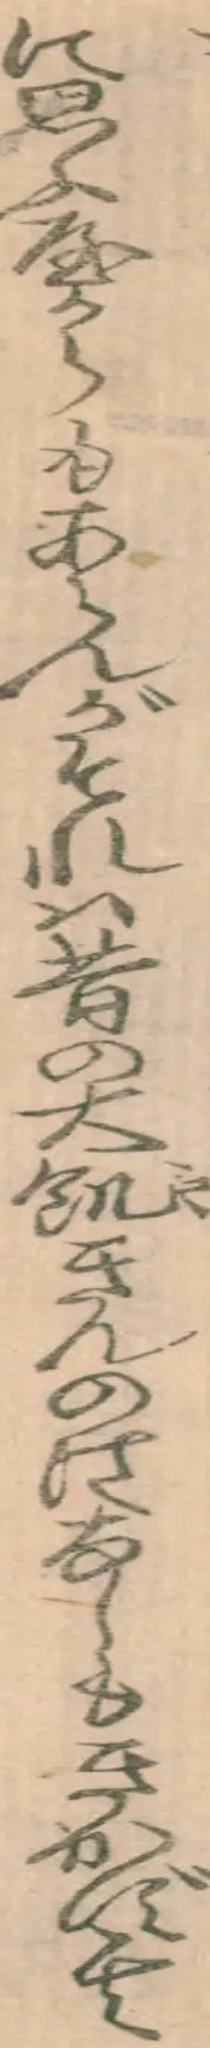に思ふやからもあらんがそれは昔の大飢きんのはなしもきかず其
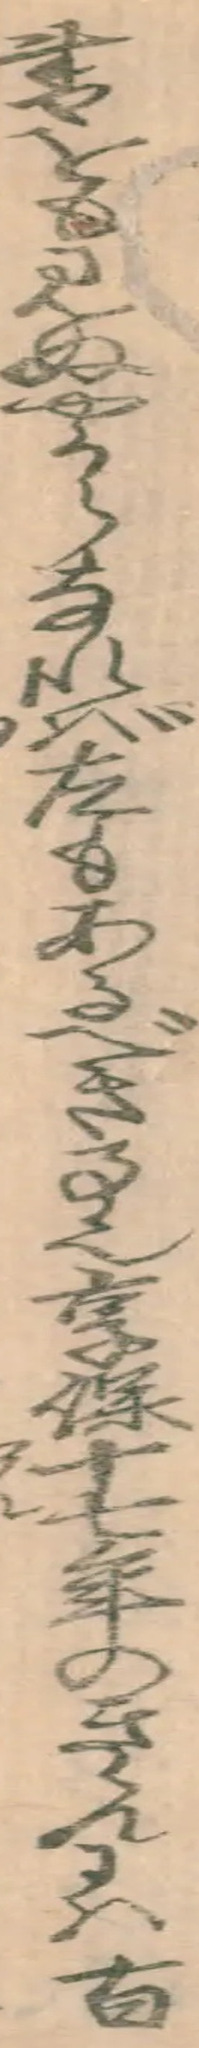書をも見ぬやからなれば左もあるべき事也享保十七年のきゝんには百
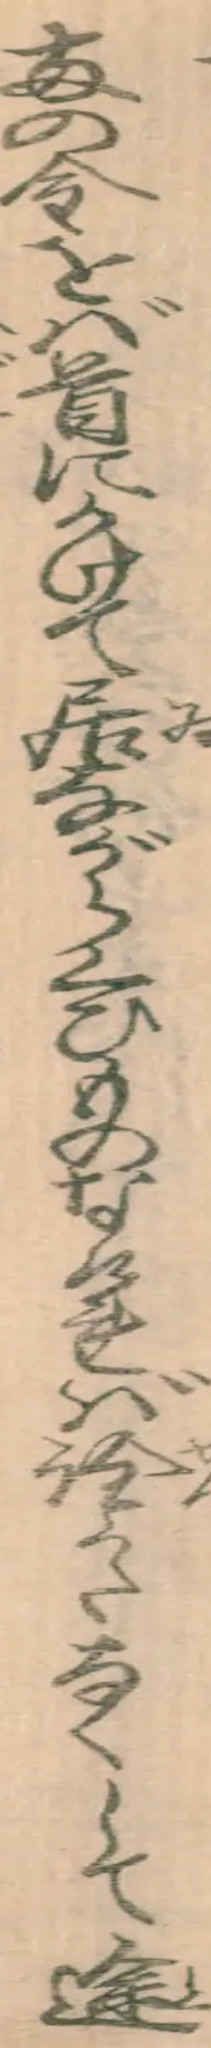両の金をば首にかけて居ながらくひものなければ詮かたなくして途
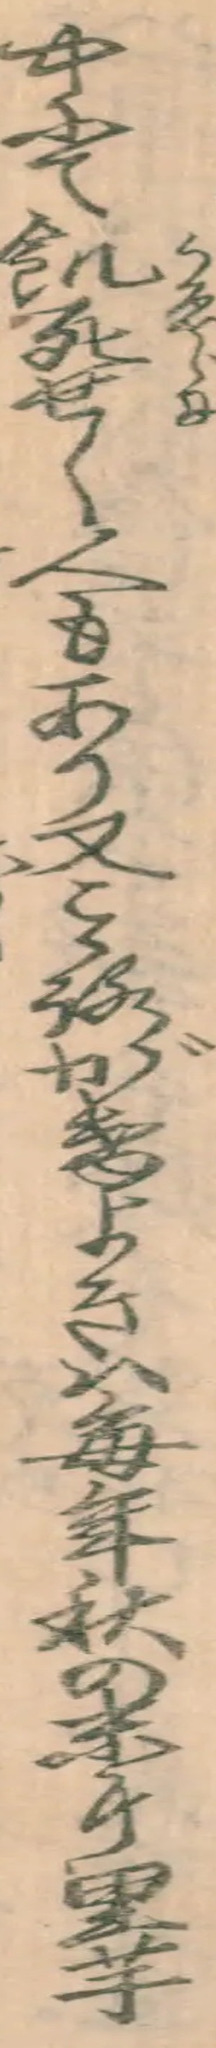中にて飢死せし人もあり又こゝろがけよきは毎年秋の末に里芋
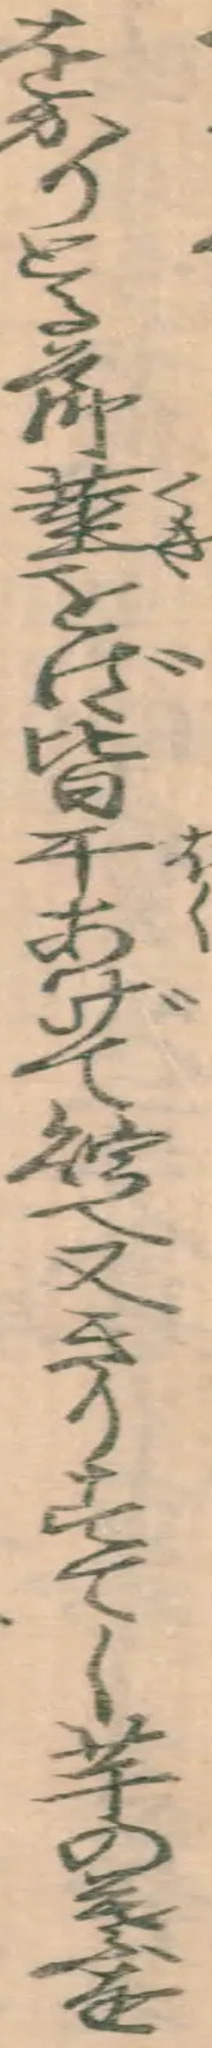をかりとる節茎をば皆干あげて貯へ又きりすてし芋の葉を
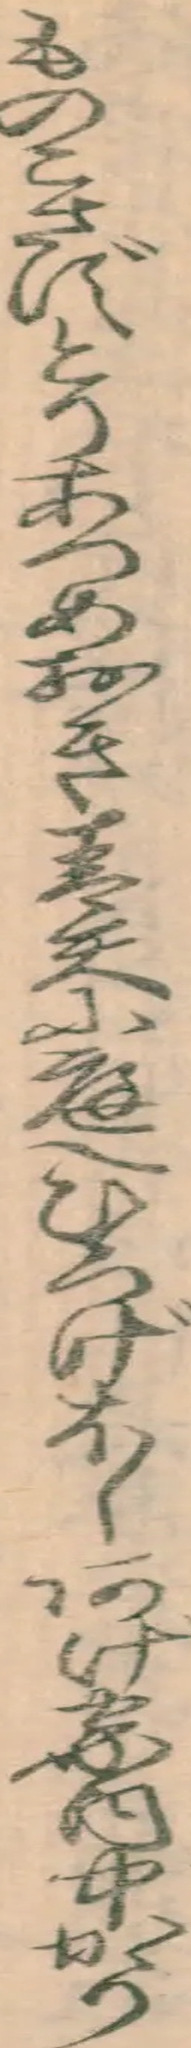ものこさずとりあつめおき青天に庭へひろげほしあげ家内中かゝり
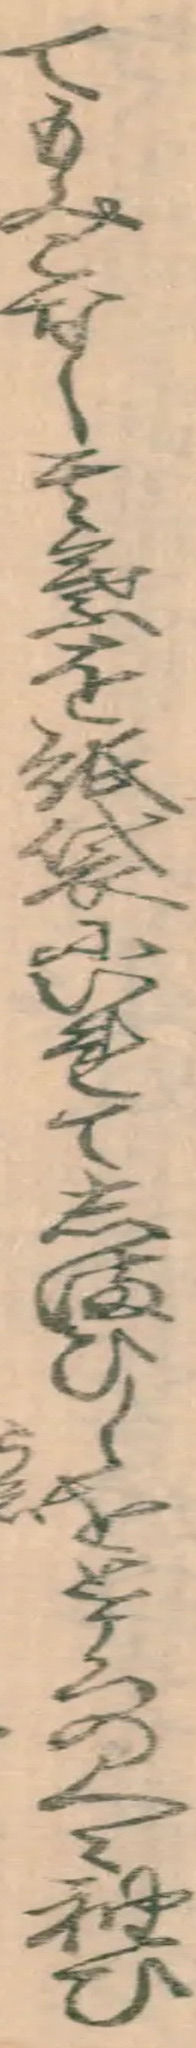てもみこなし其葉を紙袋にいれてしまひしをところの人々袖ひ
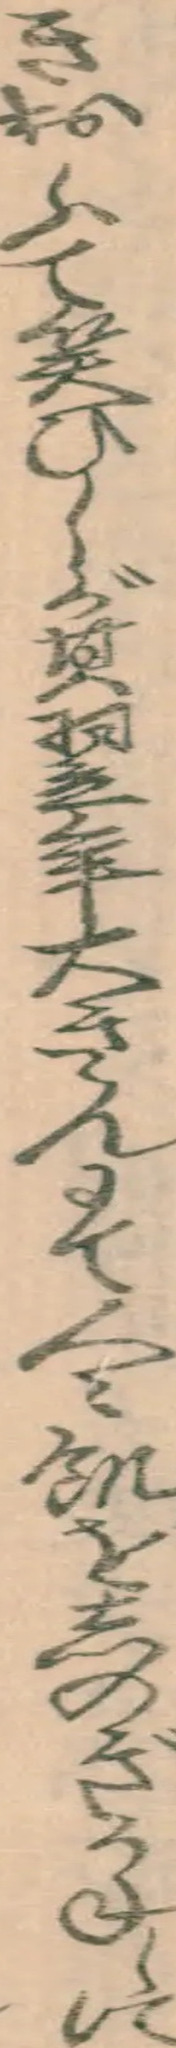きおふて笑ひしが其翌年大きゝんにて人々飢をしのぎかねしに
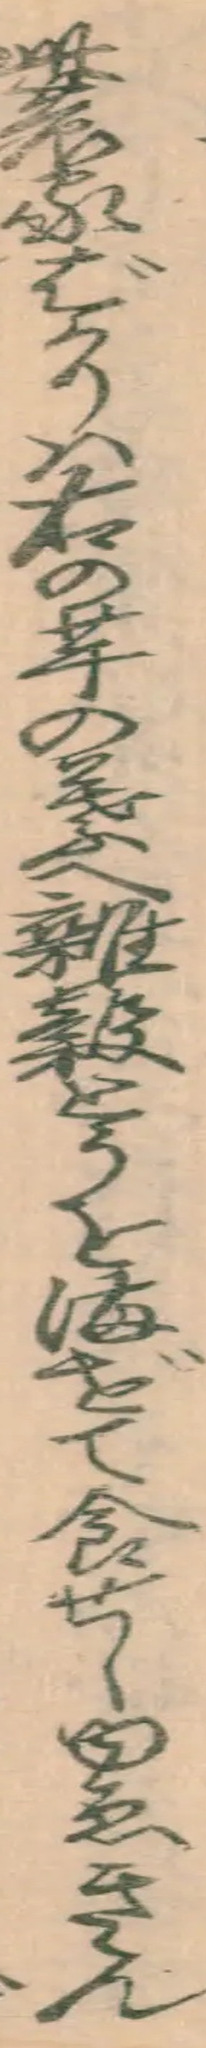此農家ばかりは右の芋の葉へ雑穀とうをまぜて食せしゆゑきゝん
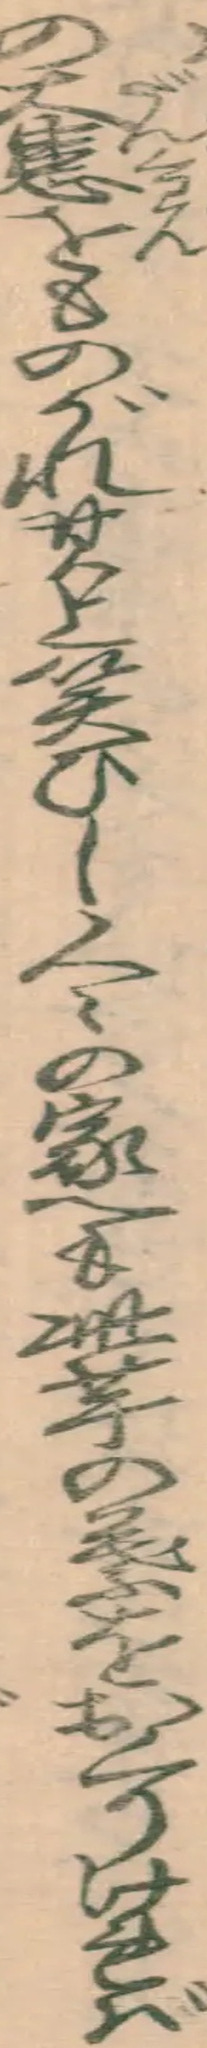の大患をものがれ其上笑ひし人々の家へも此芋の葉をおくりければ
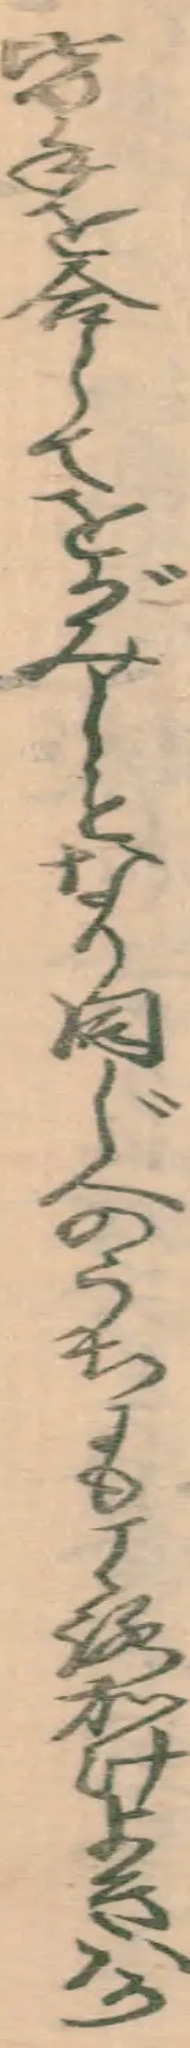皆手を合してをがみしとなり同じ人のうちにもこゝろがけよきはか
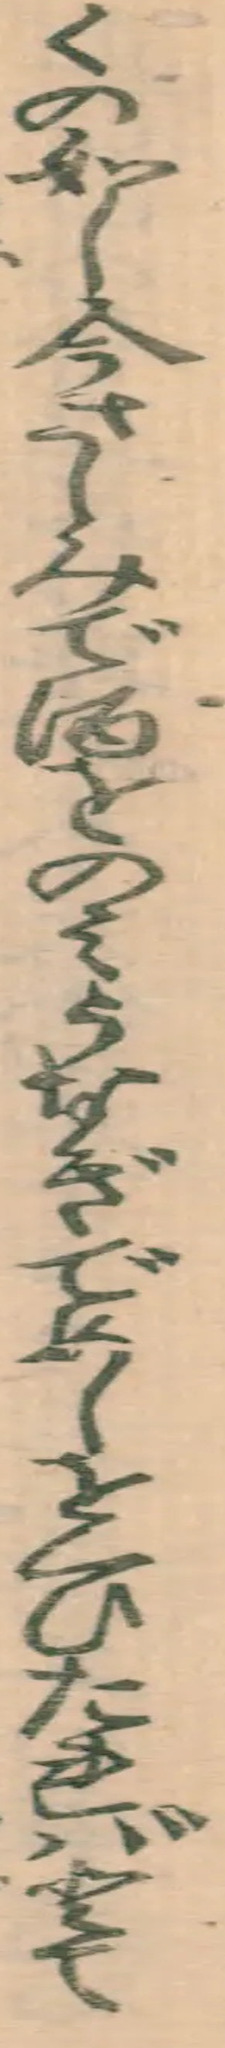くの如し今さしみで酒をのみうなぎでめしをくひたればとて
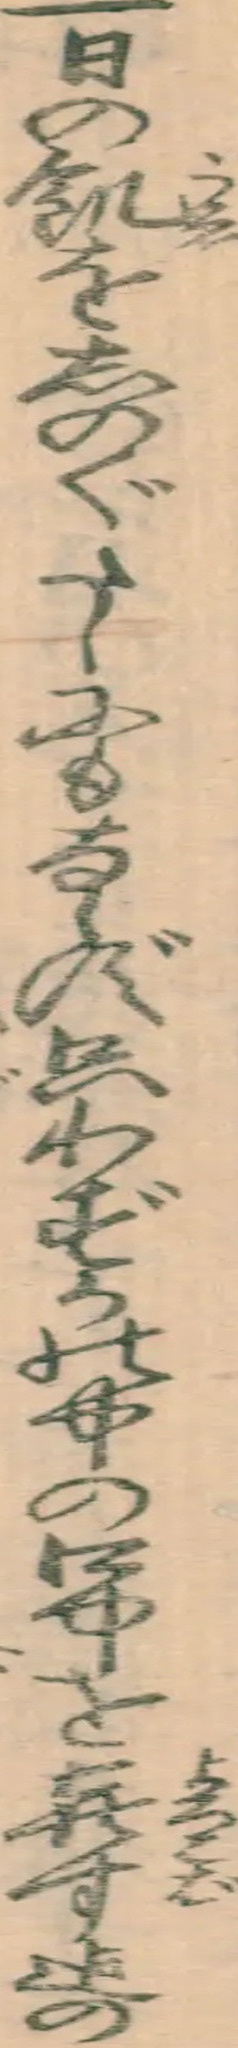一日の飢をしのぐたしにもならず只わずかの中の口中を喜す迄の
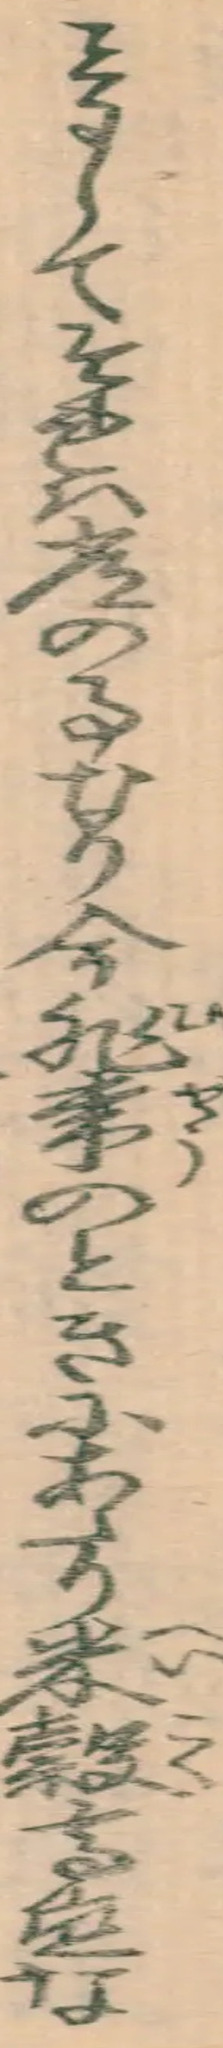ことにしてそれは常のことなり今非常のときにあたり米穀高直な
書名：日ごとの心得
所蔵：国立国会図書館 National Diet Library, JAPAN
